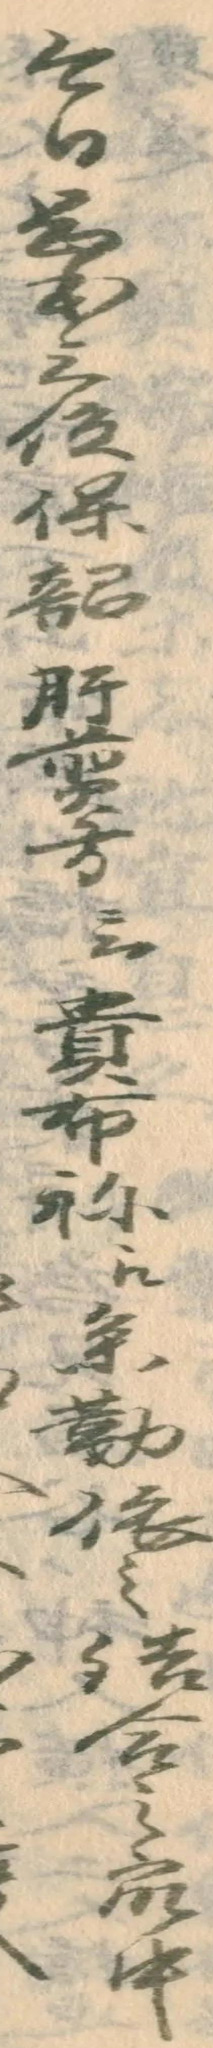今日岡本三位保韶普請方ニ而貴布祢江参勤依之詰合之衆中
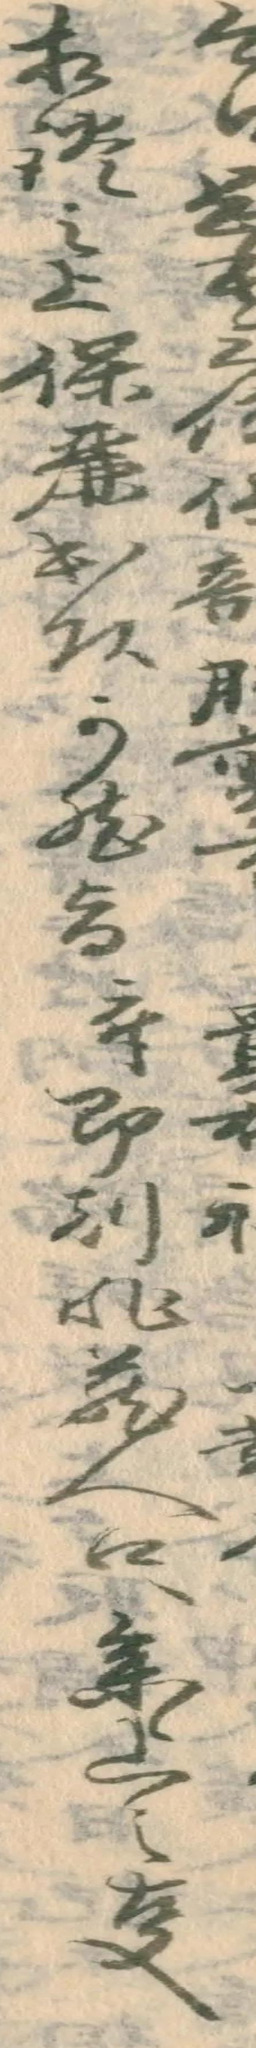相談之上保麗出頭可然旨ニ付即刻非蔵人口へ参上之事
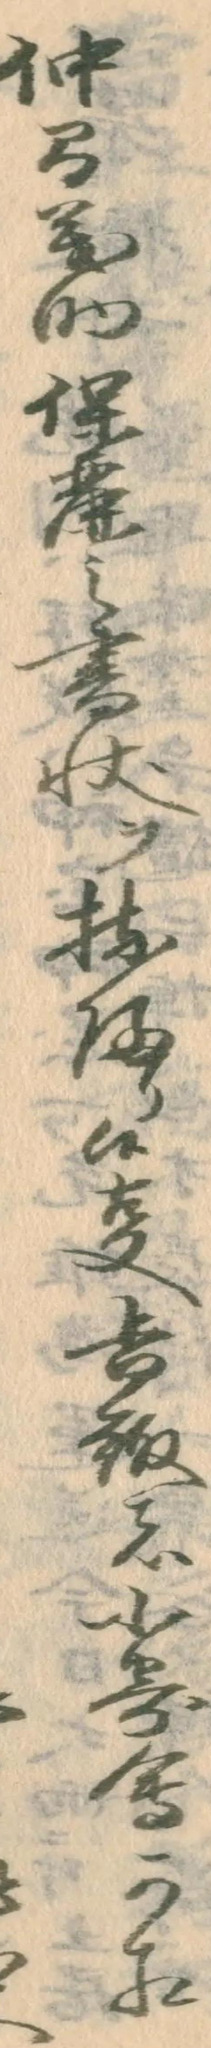一仲間義助保麗之書状ヲ持帰り候事吉報は小寄会可相
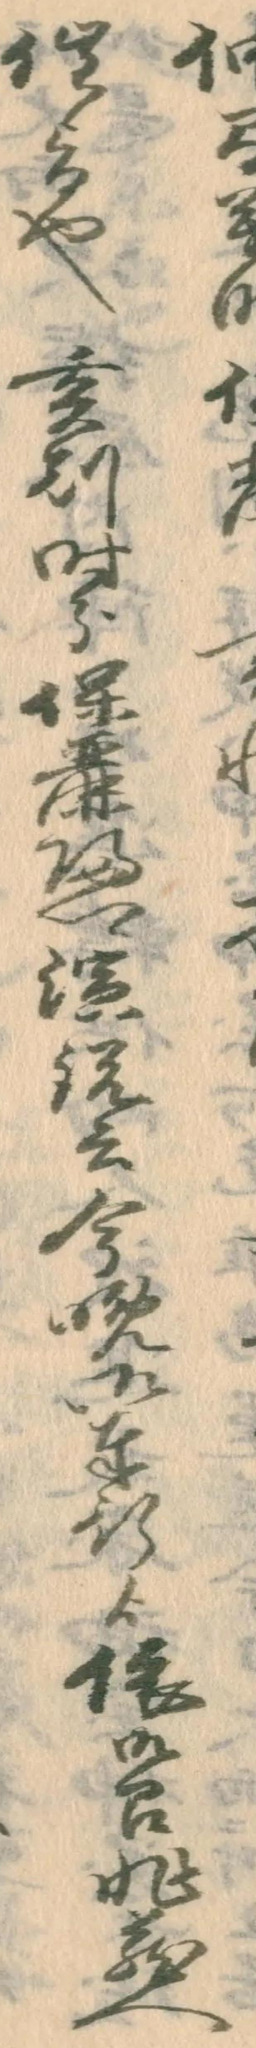程旨也亥刻時分保麗帰郷演説云今晩御奉行ゟ依御召非蔵人
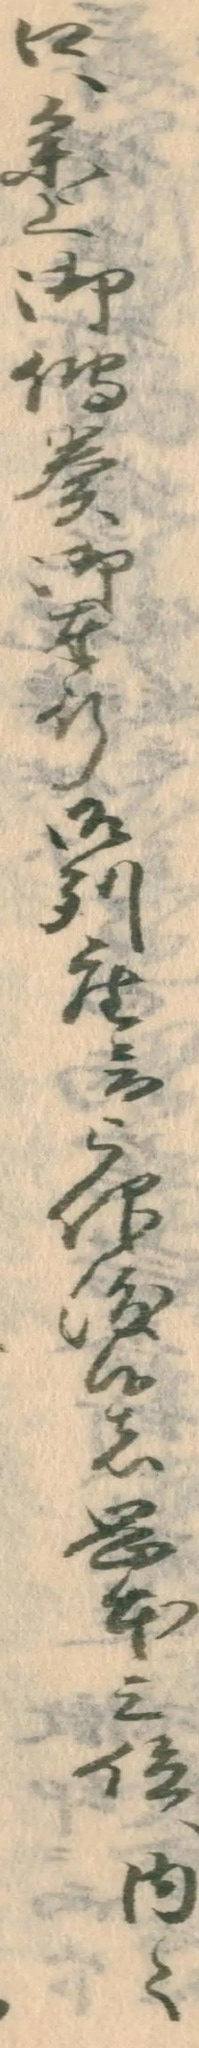口へ参上御伝奏御奉行御列座ニ而被仰渡候は岡本三位へ内々
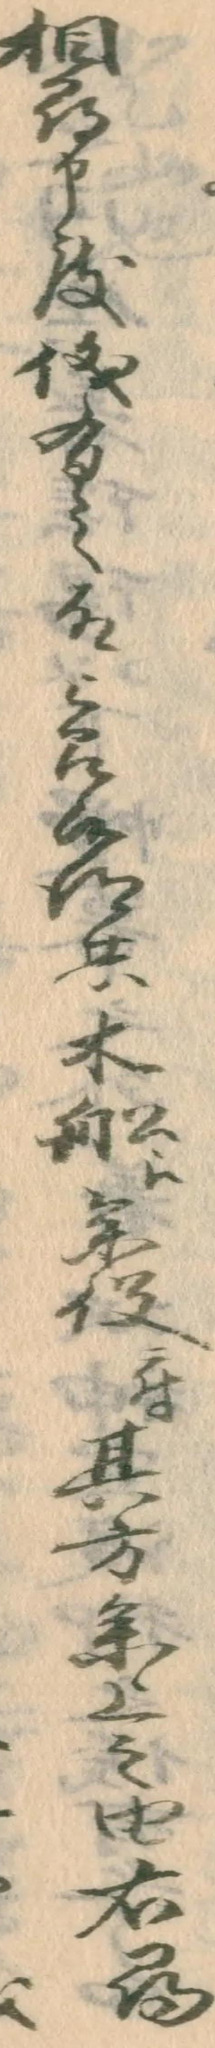相尋申度儀有之故被召候得共木船江参役ニ付其方参上之由右尋
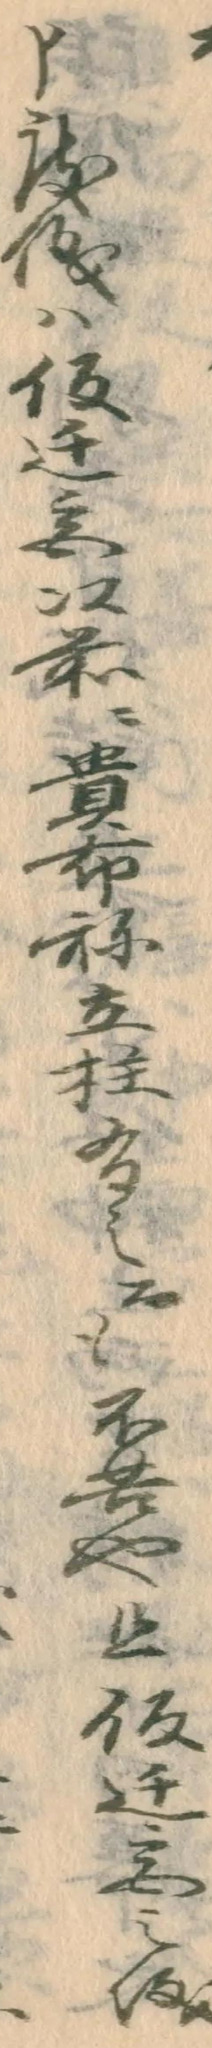申度儀ハ仮迁宮以前ニ貴布祢立柱有之而も不苦也且仮迁宮之儀
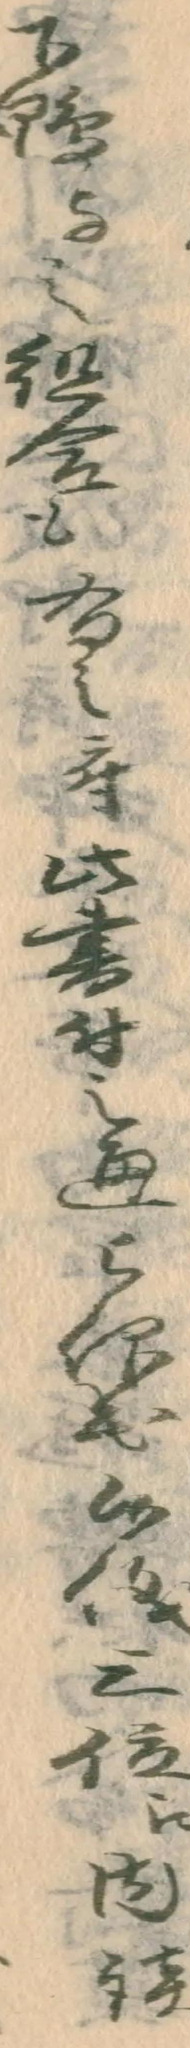下鶴与之組合も有之ニ付此書付之通被仰出候儀三位江内談
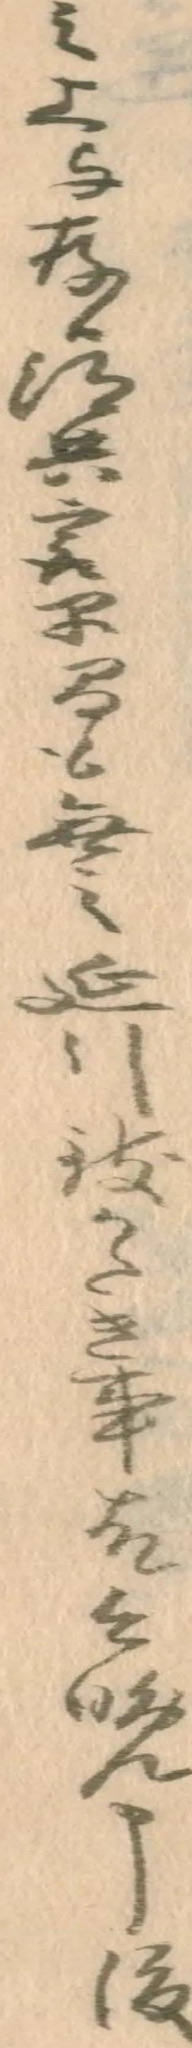之上与存候得共最早間も無之延引致かたき事故今晩申渡
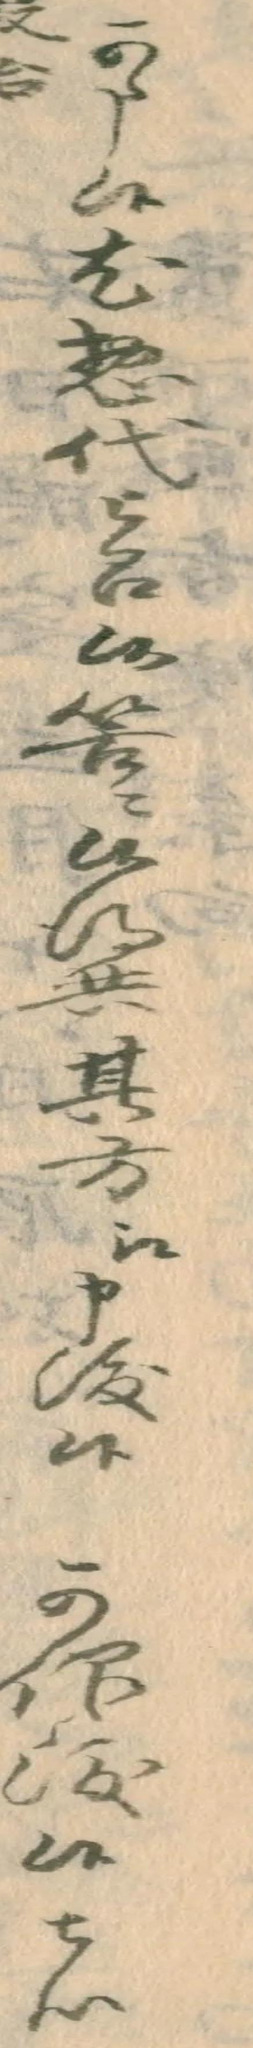可申候尤惣代被召候筈ニ候得共其方江申渡候可仰渡候は
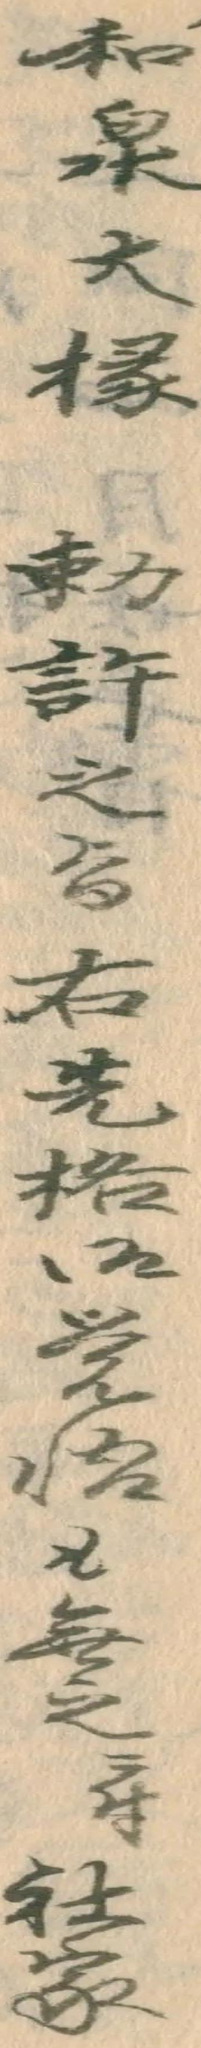和泉大掾勅許之旨右先格御覚悟も無之ニ付社家
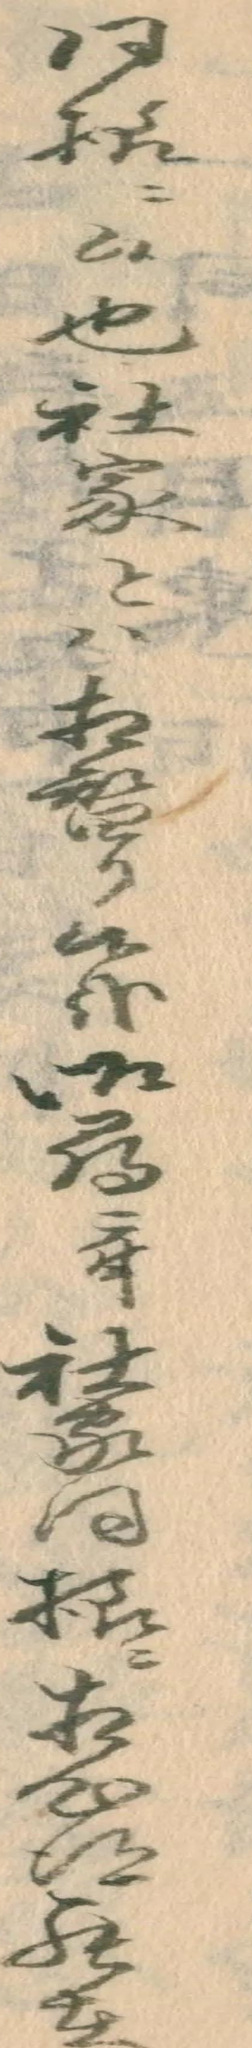同様ニ候也社家とハ相替り候哉御尋ニ付社家同様ニ相心得罷在
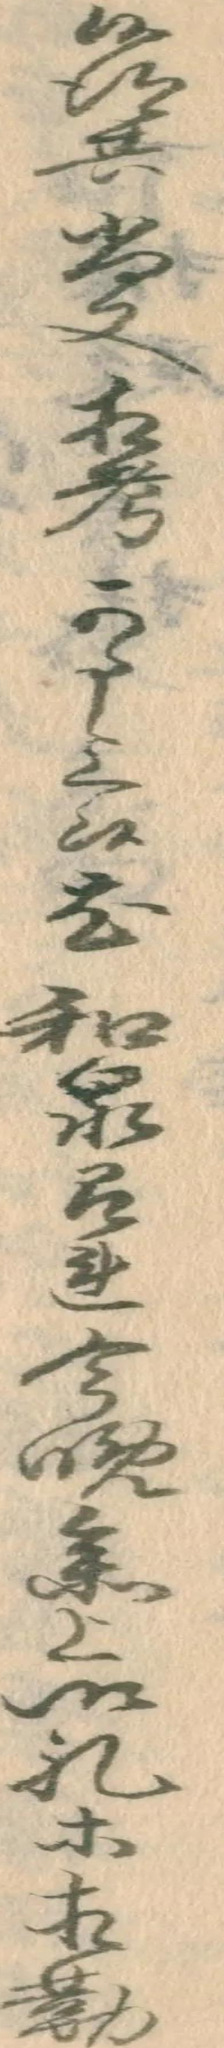候得共尚又相考可申上候尤和泉召連今晩参上御礼等相勤
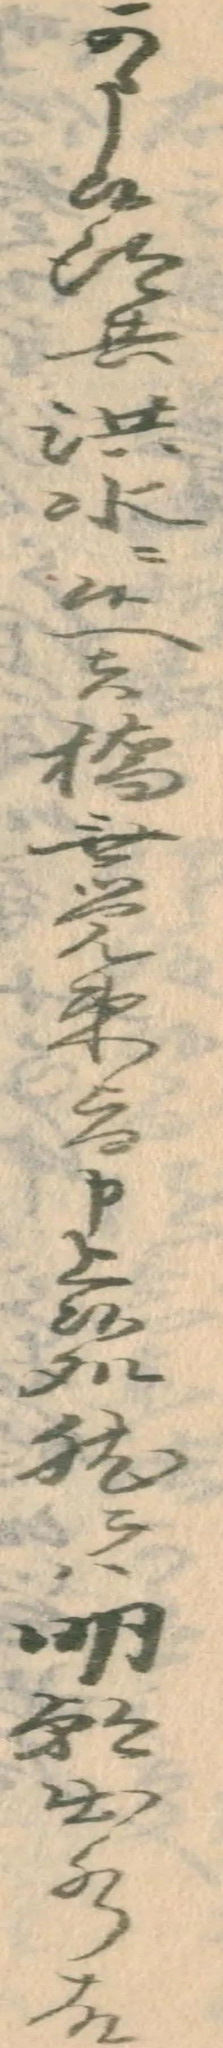可申候得共洪水ニ候へは橋無覚束旨申上候処然ラハ明朝出水故
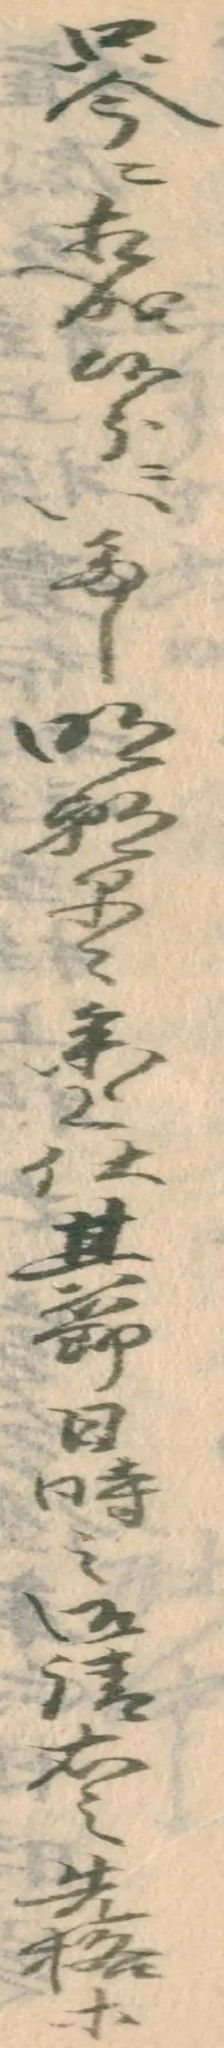只今ニ相成候分ニいたし明朝早々参上仕其節日時之御請右之先格等
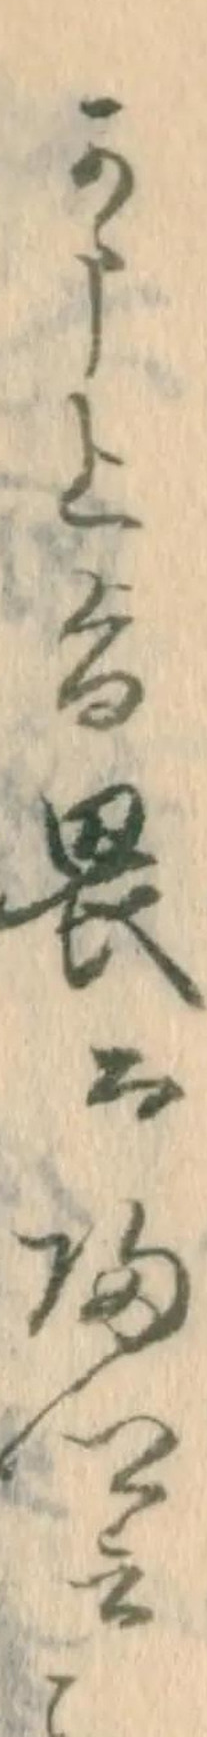可申上旨畏而帰郷云々
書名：賀茂社記録. 第17冊
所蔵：国立国会図書館 National Diet Library, JAPAN
